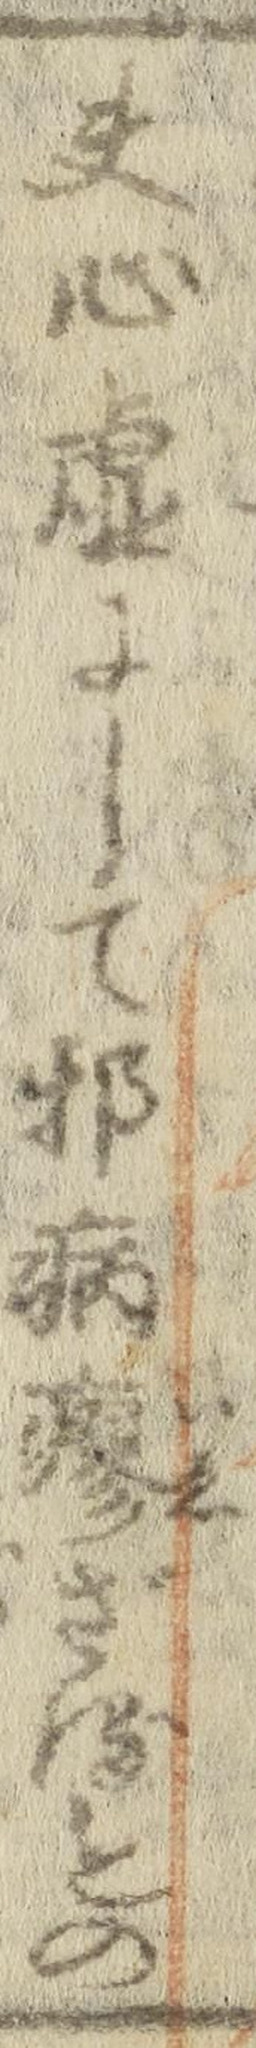夫心虚にして邪病瘳ざるもの
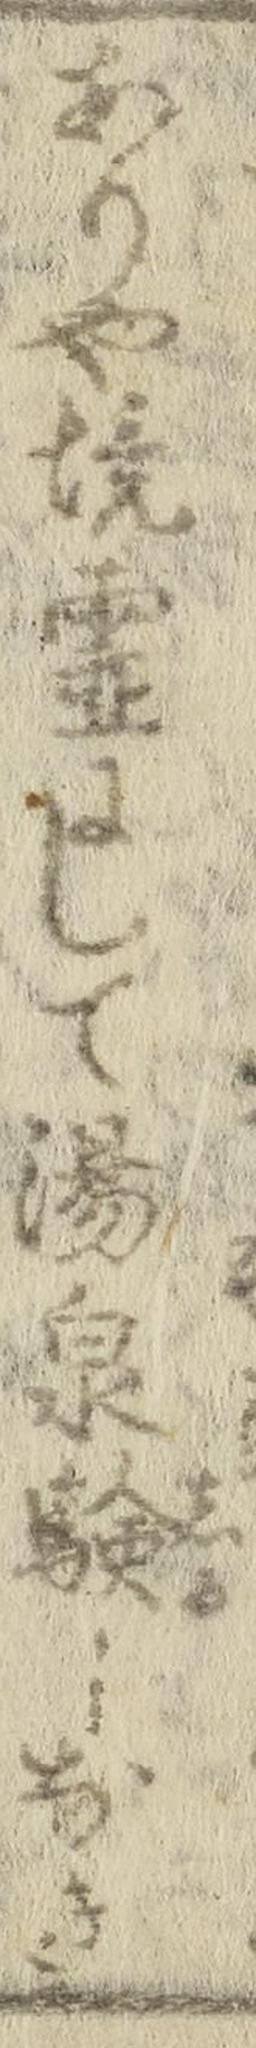ありや境霊にして湯泉験しなき
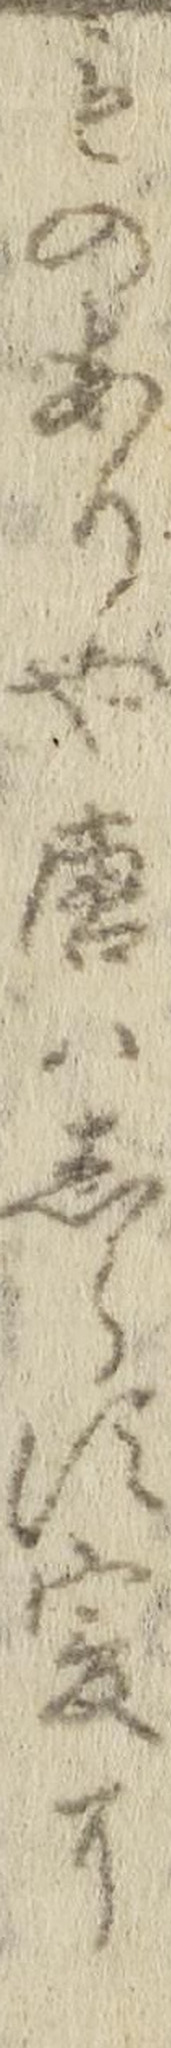ものありや唐はしらず爰に
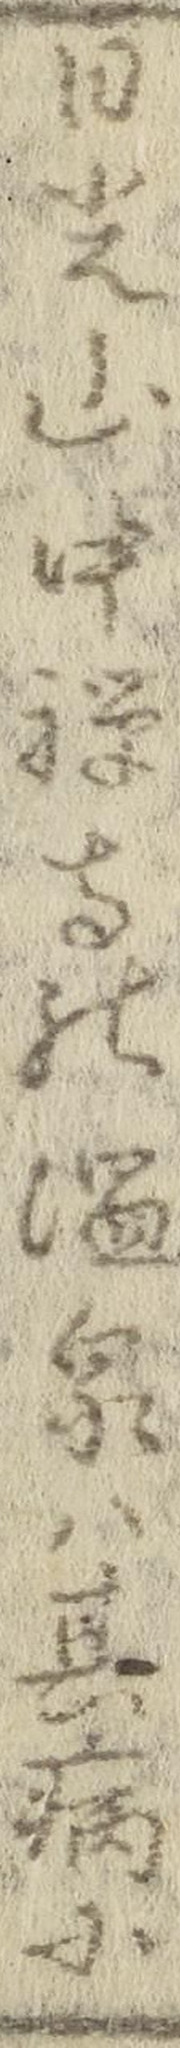日光山中禅寺の温泉は其病に
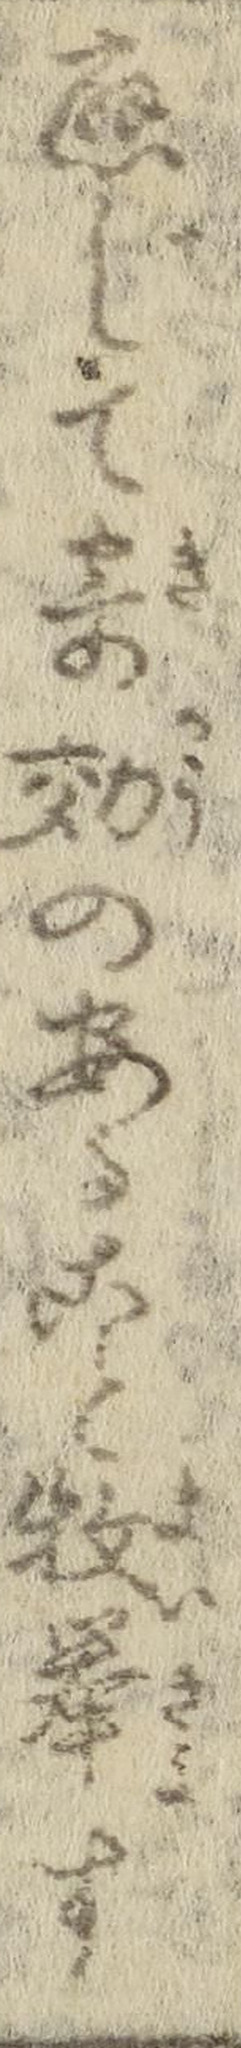応じて奇効のあること枚挙す
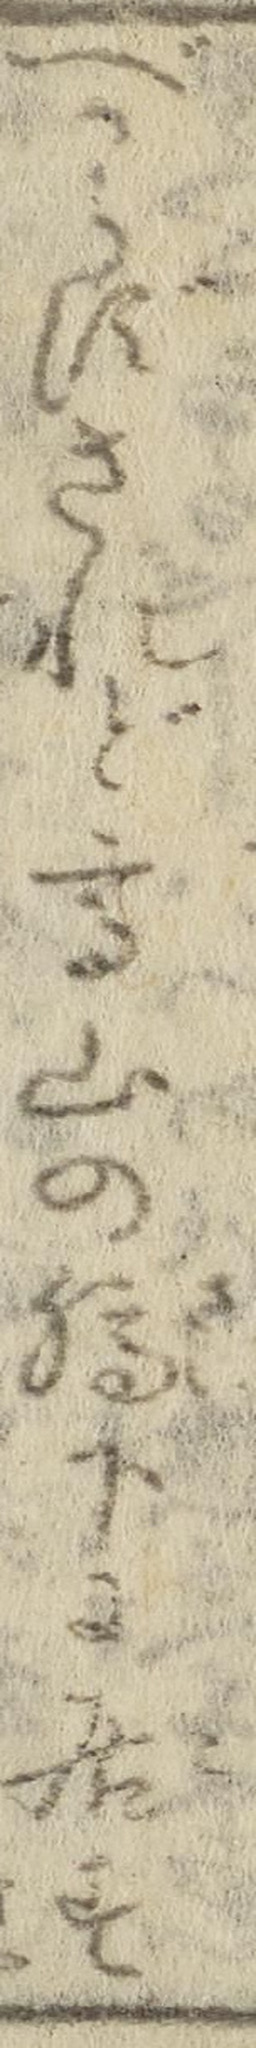べからずされど高山の臍下に居す
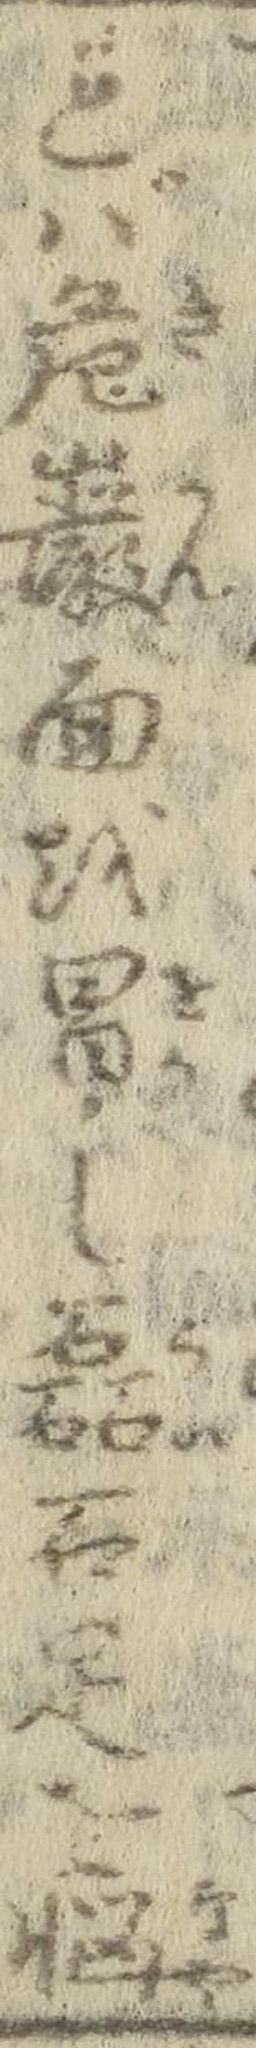れば危巌面を冒し磊石足を悩
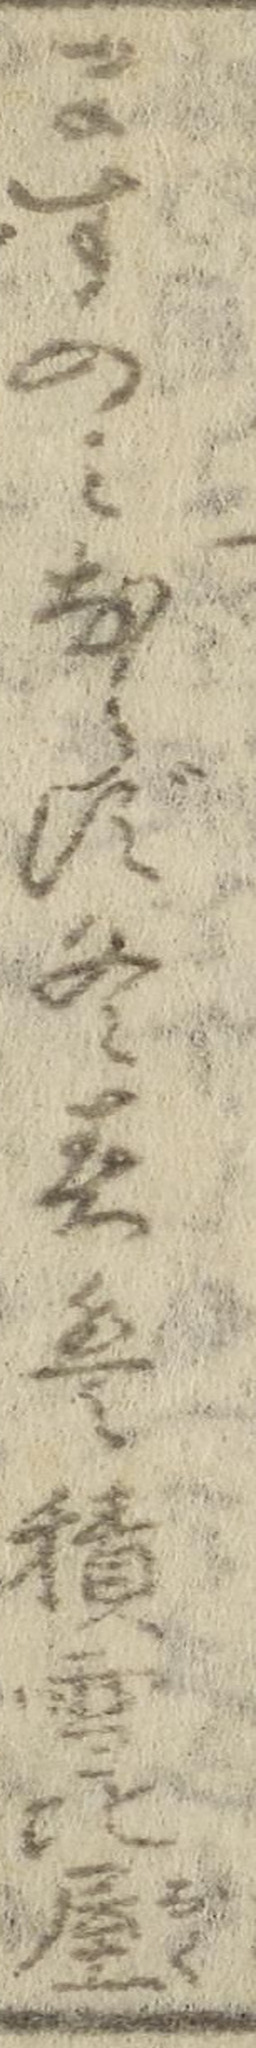ますのみならず冬春は積雪比屋
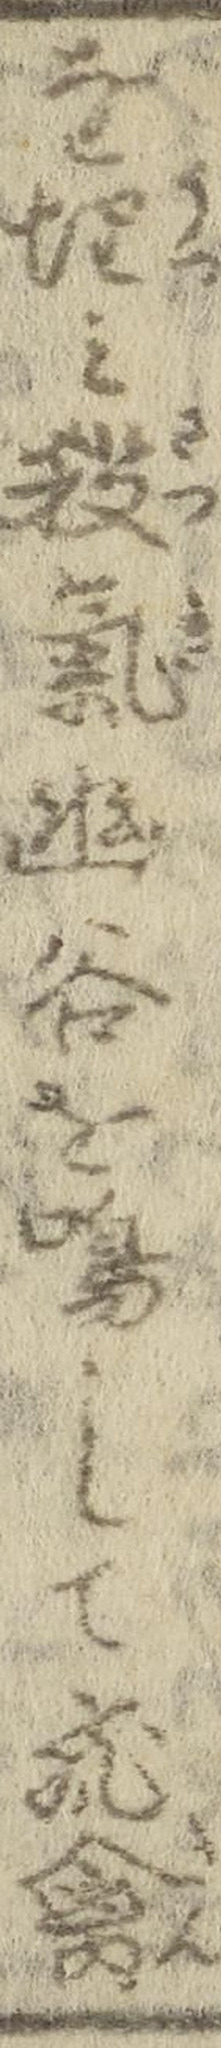を埋み殺気幽谷を鳴して飛禽
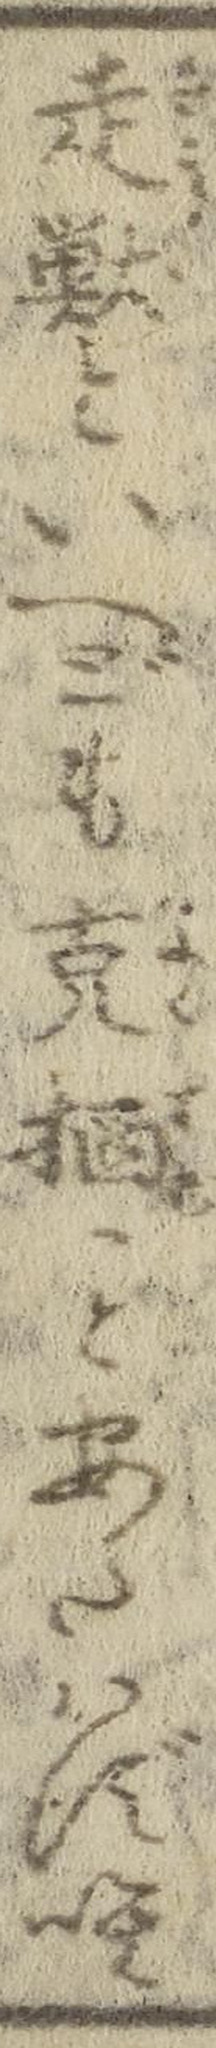走獣といへども克栖ことあたはず唯
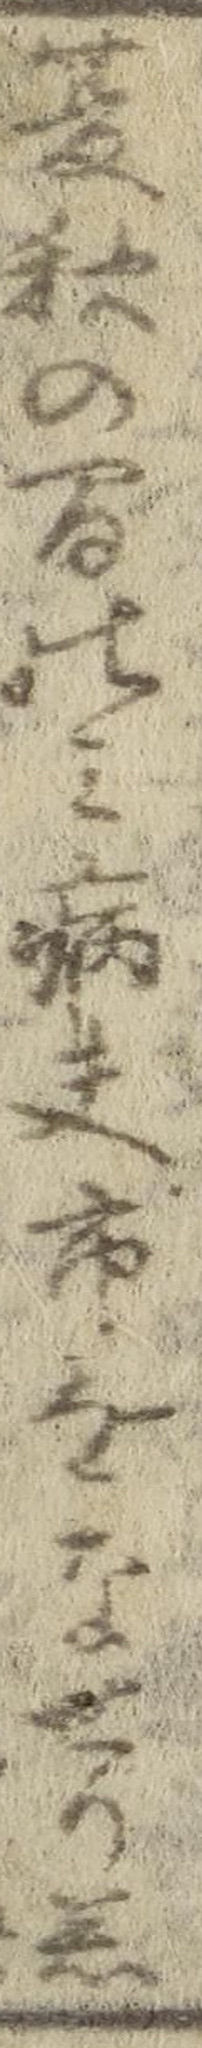夏秋の間のみ病-夫市をなせり若
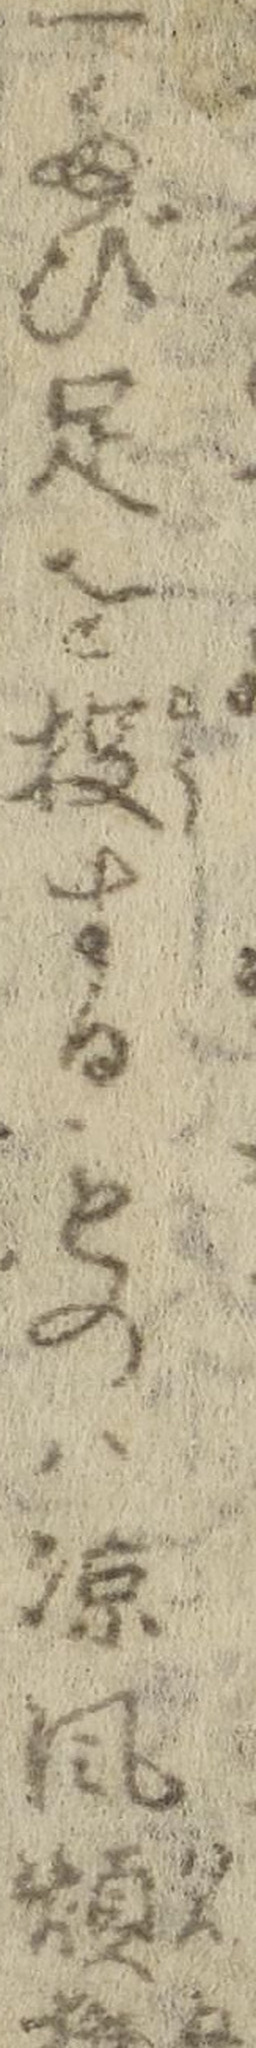一たび足を投するものは涼風煩熱
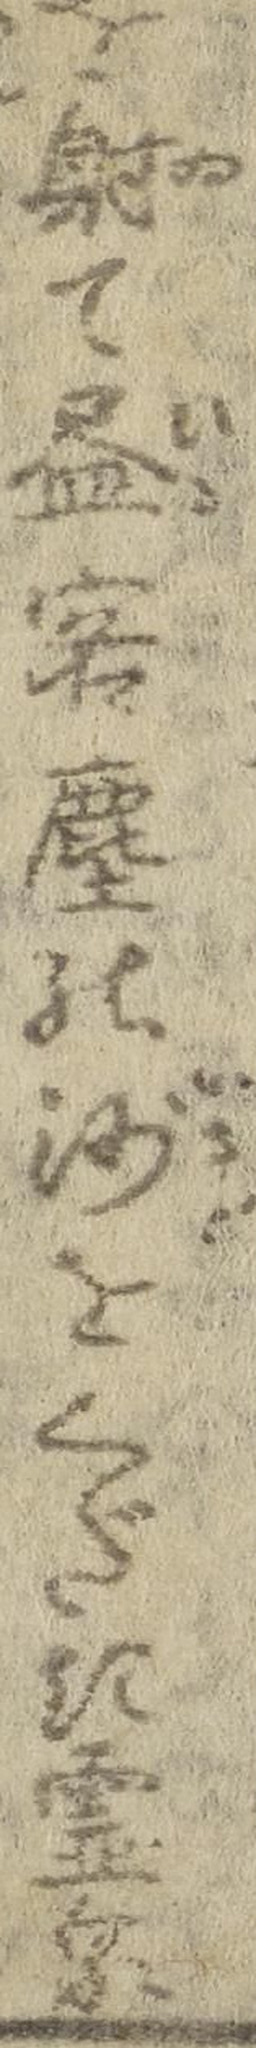を射て昼客塵の沙をくだき霊泉
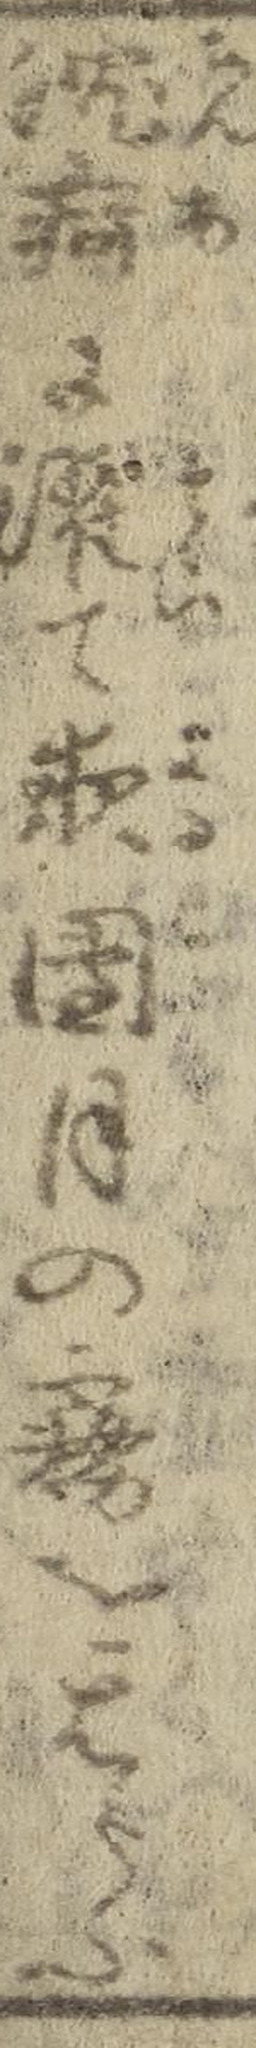沈疴に濯て夜団月の霧をはらふ

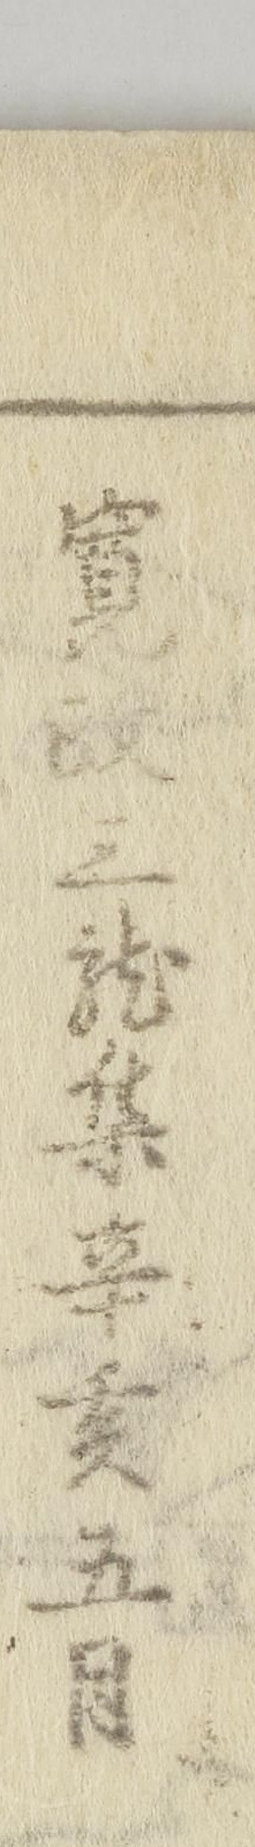寛政三龍集辛亥五月
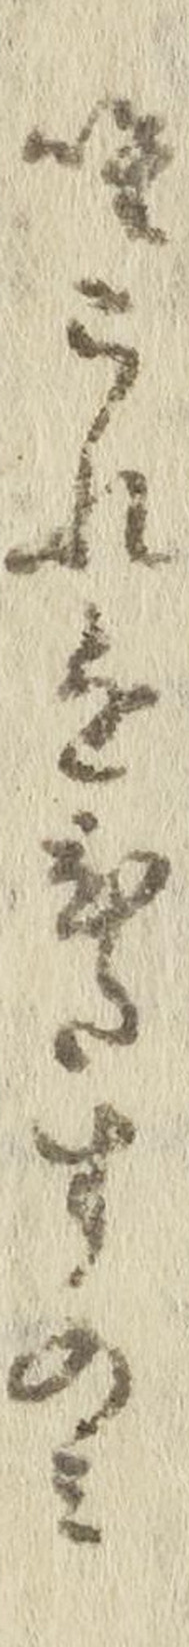唯これをひたすのみ
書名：日光山中禅寺　温泉記　全
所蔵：東京大学地震研究所図書室 Earthquake Research Institute Library, The University of Tokyo, JAPAN
